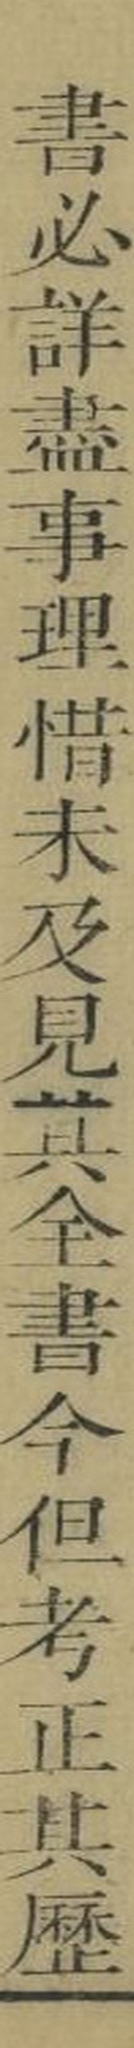書必詳尽事理惜未及見其全書今但考正其歴
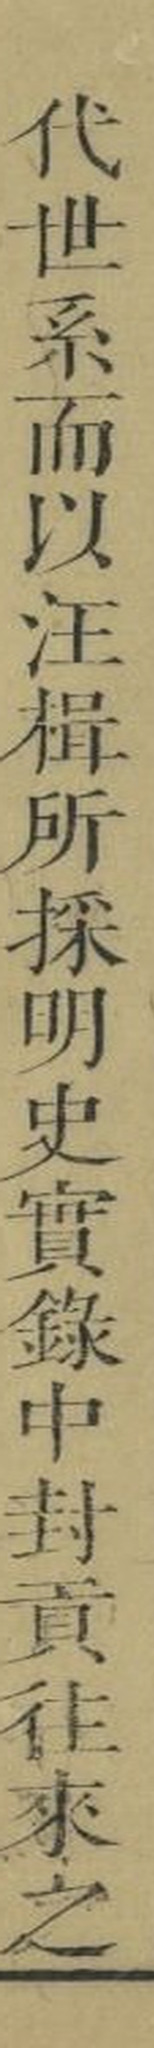代世系而以汪楫所採明史実録中封貢往来之
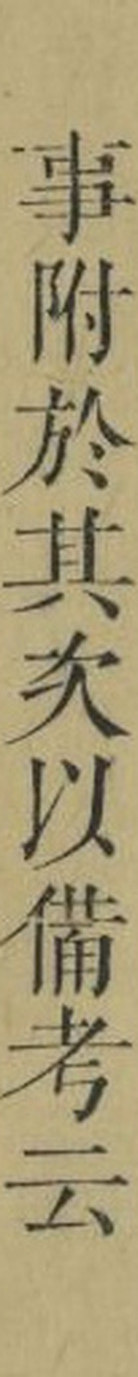事附於其次以備考云
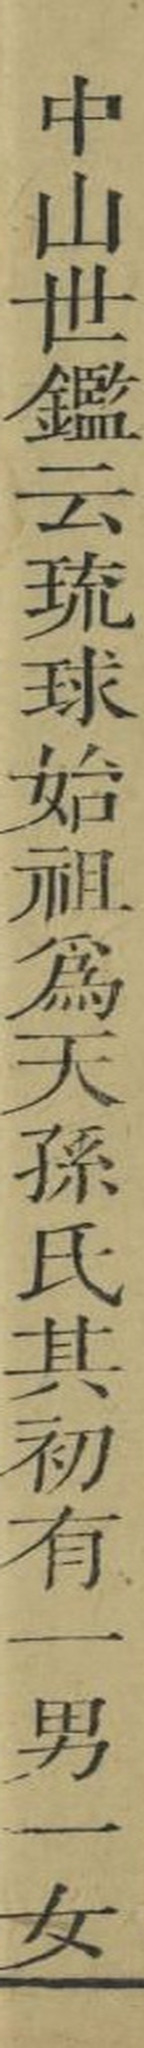中山世鑑云琉球始祖為天孫氏其初有一男一女
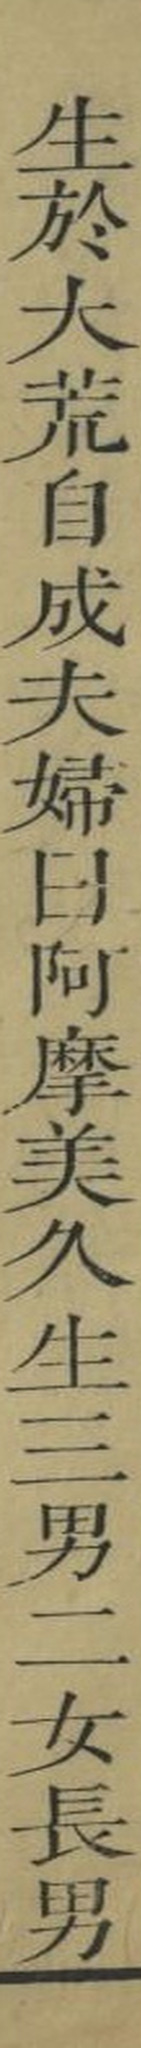生於大荒自成夫婦曰阿摩美久生三男二女長男
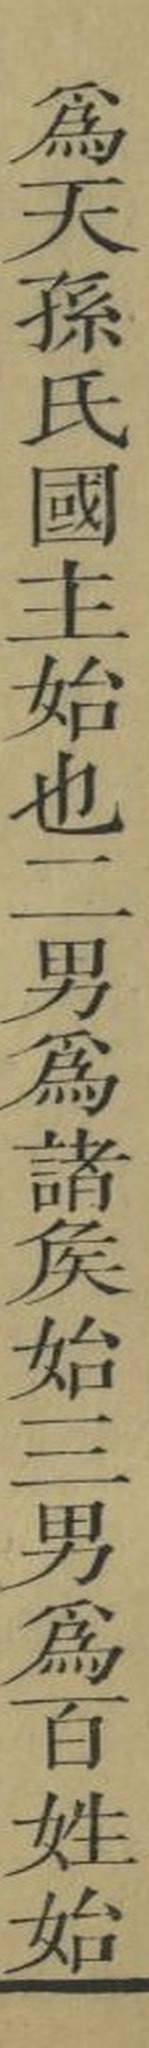為天孫氏国主始也二男為諸侯始三男為百姓始
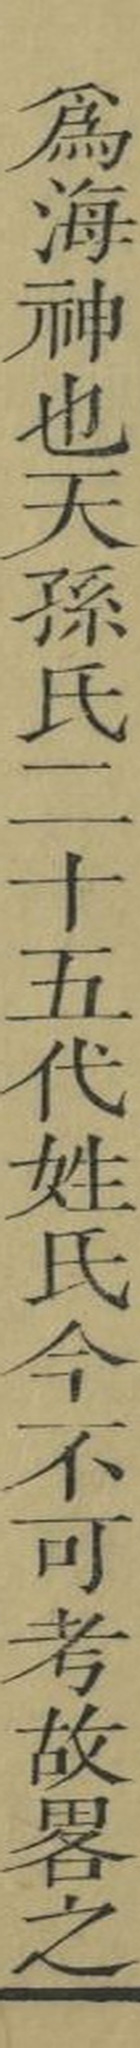為海神也天孫氏二十五代姓氏今不可考故略之
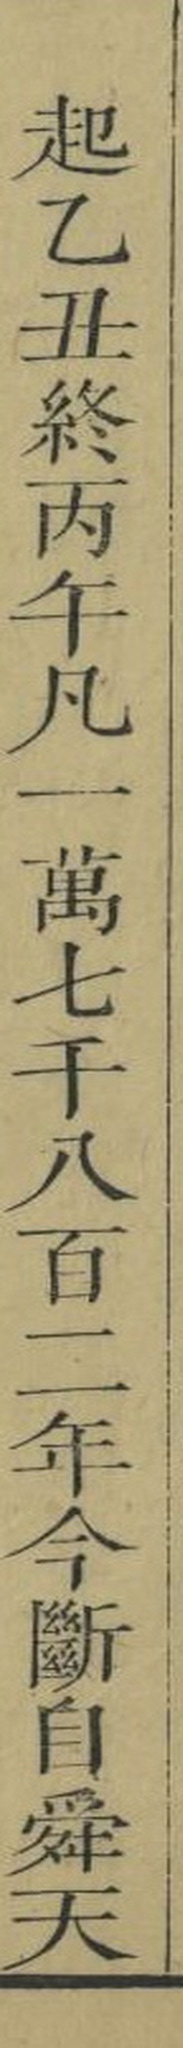起乙丑終丙午凡一万七千八百二年今断自舜天
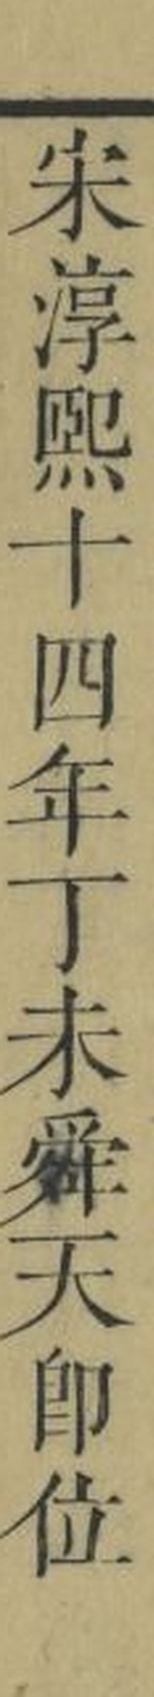宋淳熙十四年丁未舜天即位
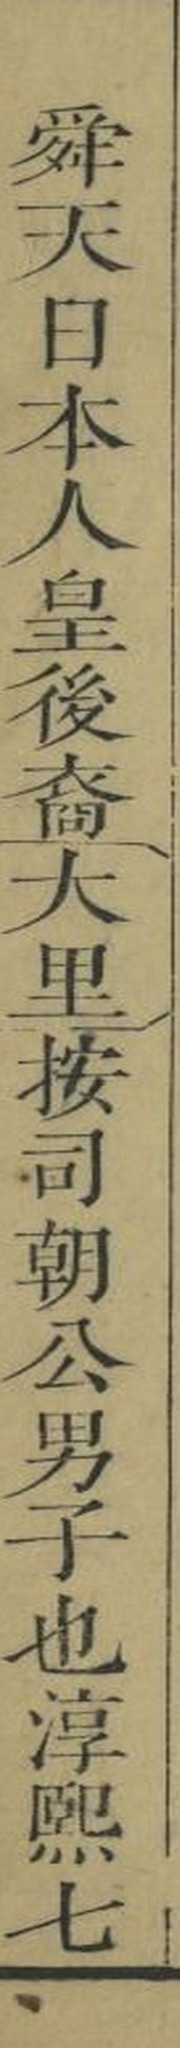舜天日本人皇後裔[大里]按司朝公男子也淳熙七

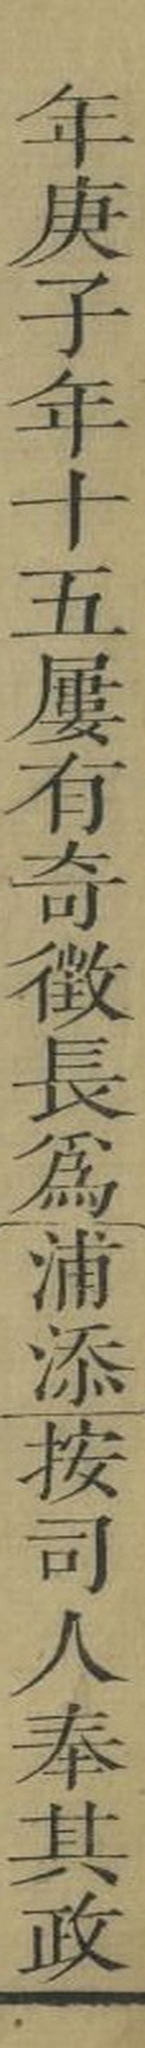年庚子年十五屢有奇徴長為[浦添]按司人奉其政
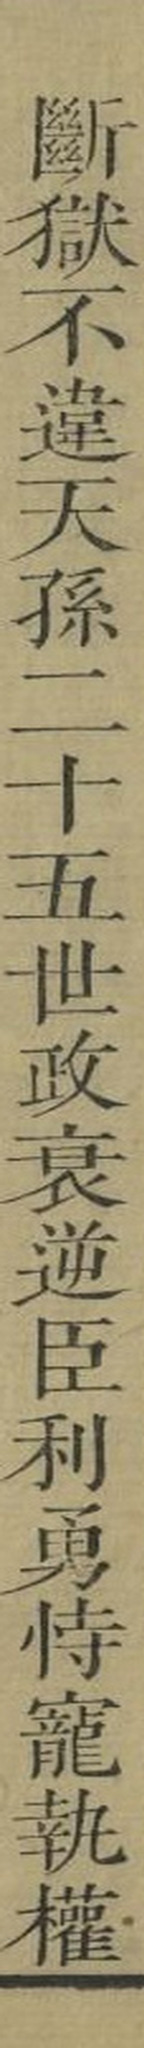断獄不違天孫二十五世政衰逆臣利勇恃寵執権
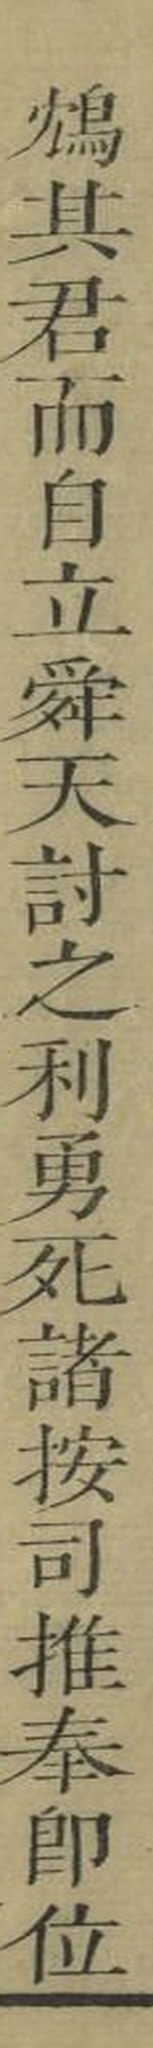鴆其君而自立舜天討之利勇死諸按司推奉即位
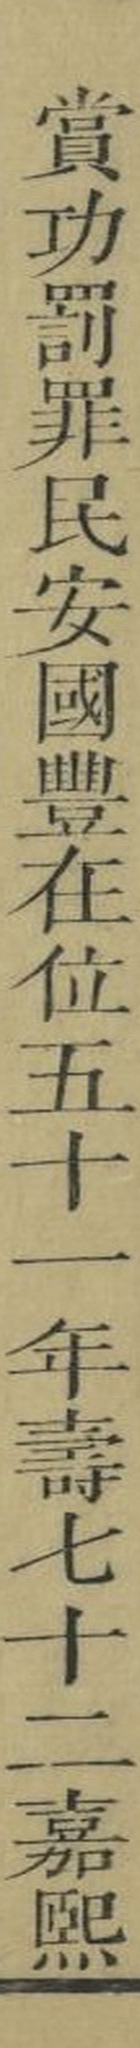賞功罰罪民安国豊在位五十一年寿七十二嘉熙
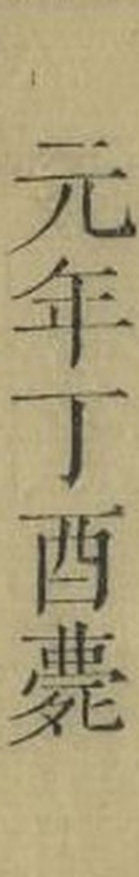元年丁酉薨
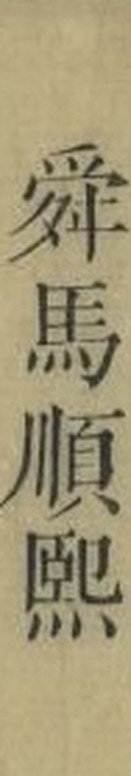舜馬順熙
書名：中山伝信録 巻三
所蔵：University of the Ryukyus Library
